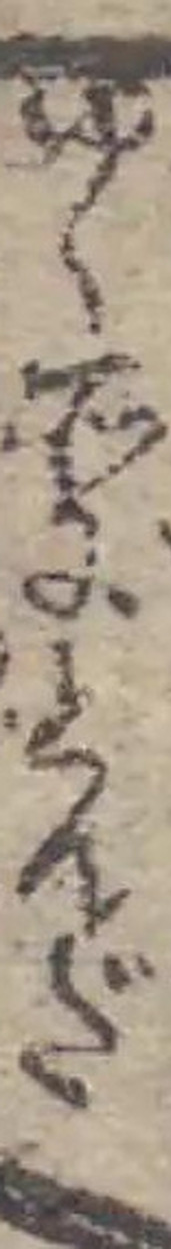ゆく所にとんだ
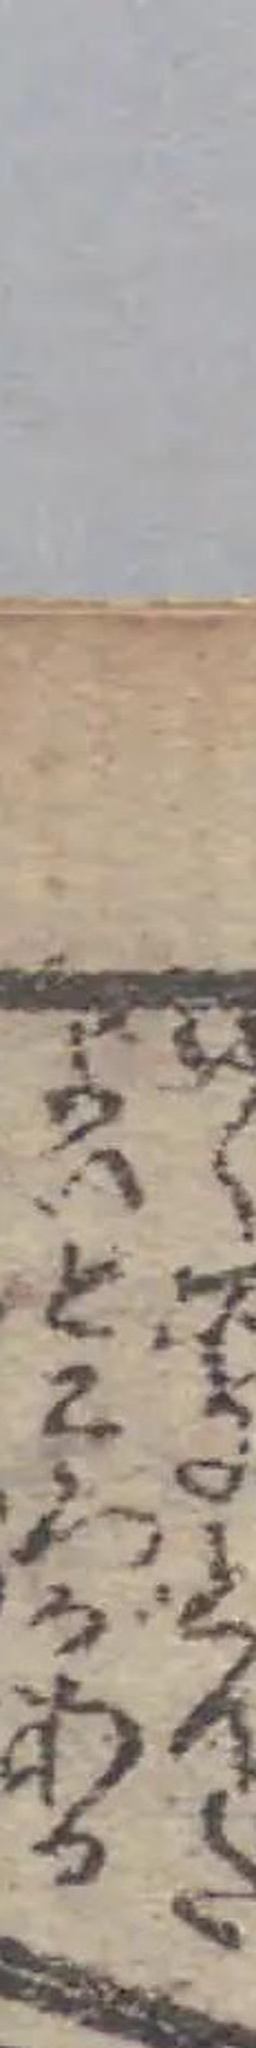よいところがある
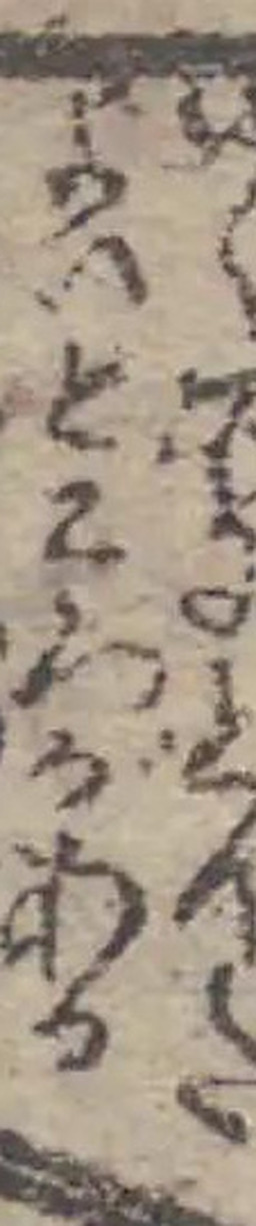よいところがある
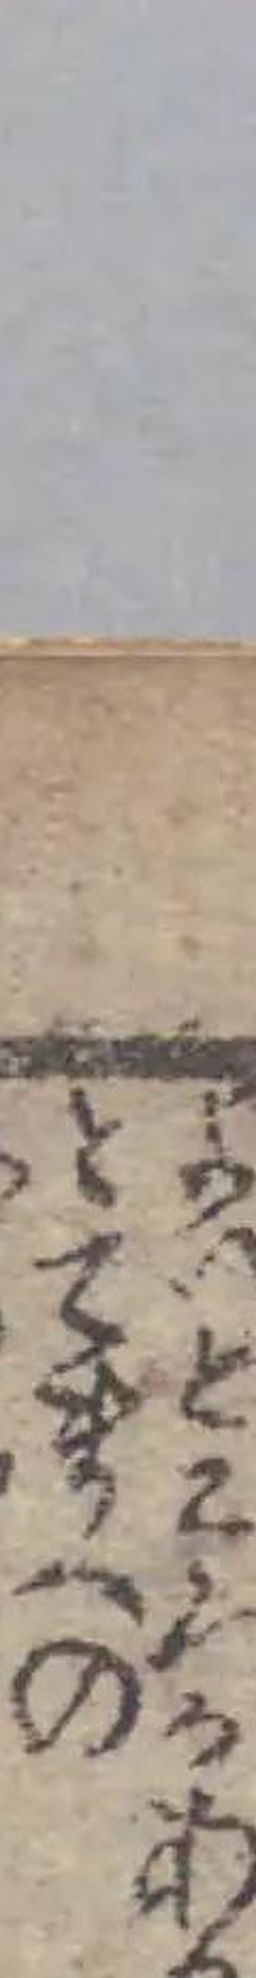とてまへの
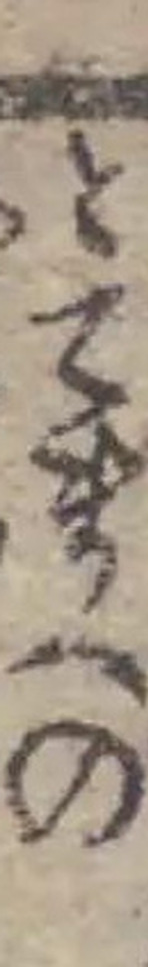とてまへの
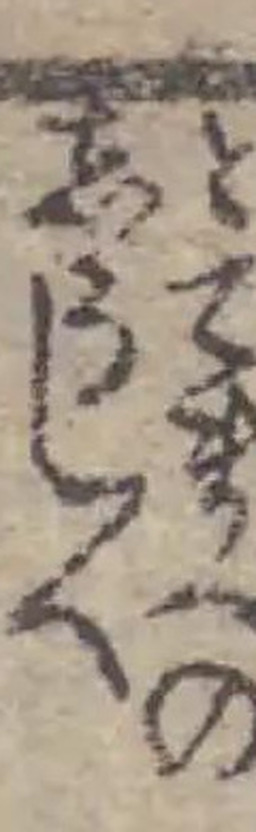しうしへ
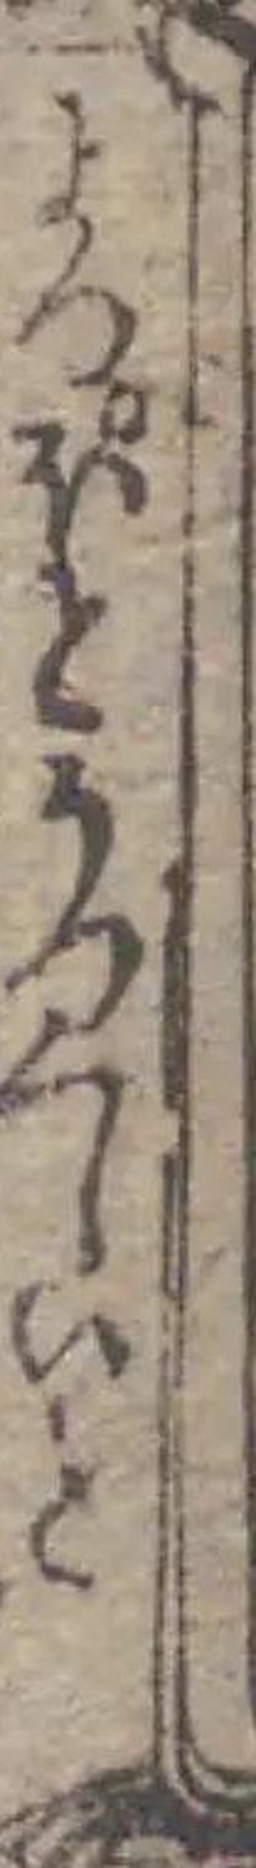よつぽとうつくしいと
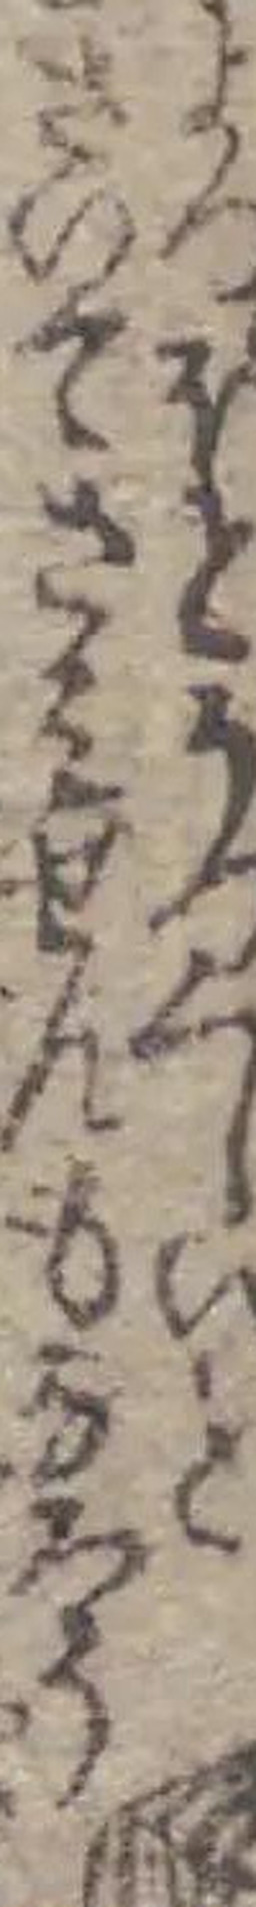きいてさみせんもなろう
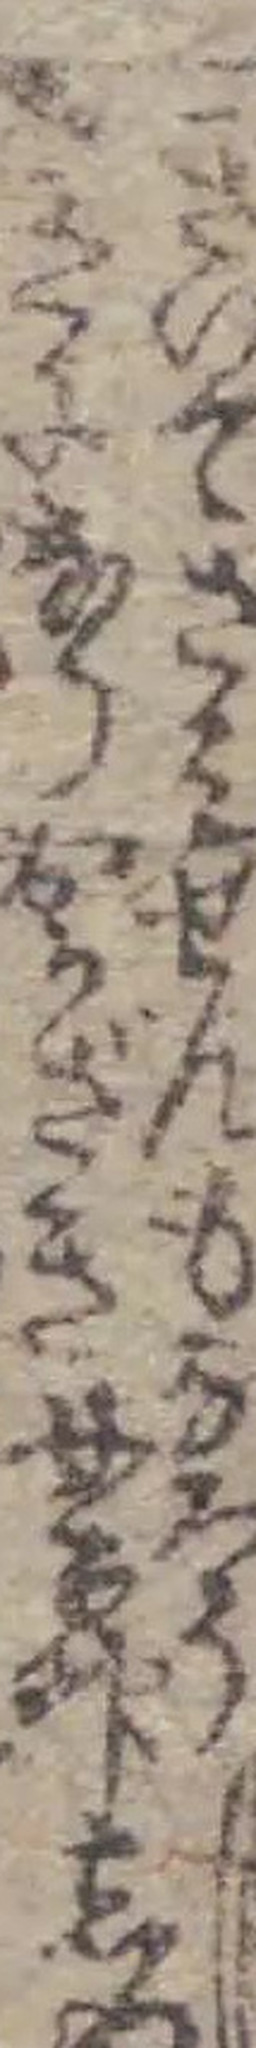きになりおかざき女郎しゆ
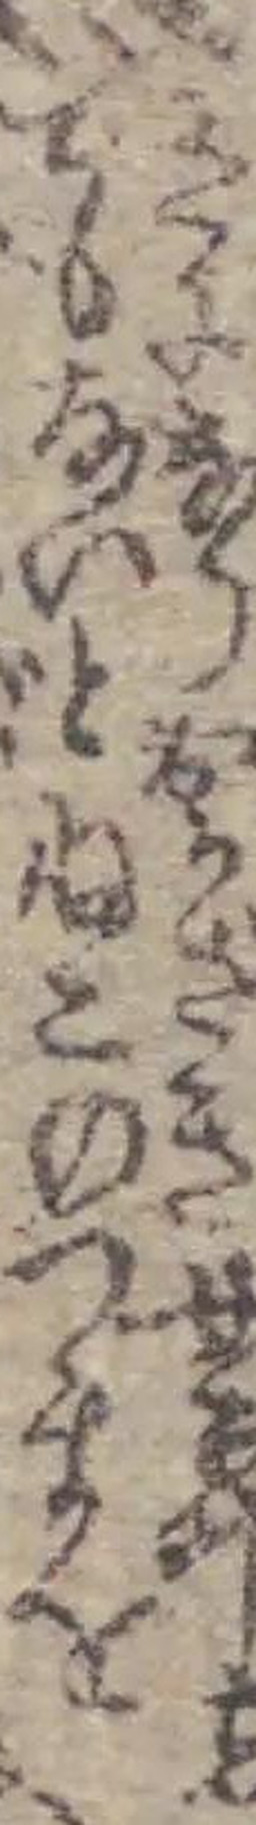でもないとねこのつまを
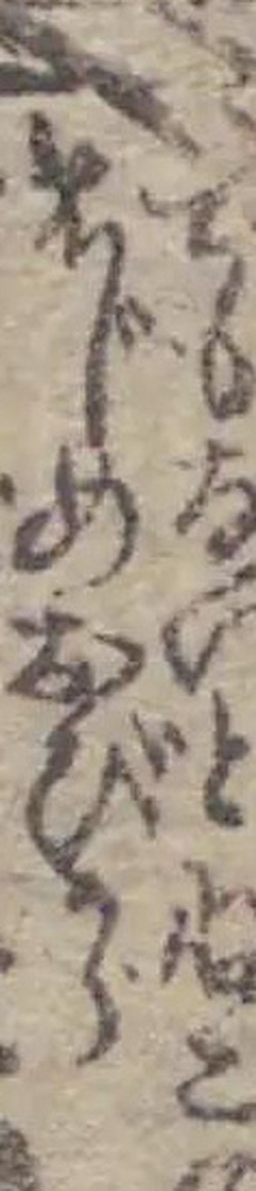はじめおびから
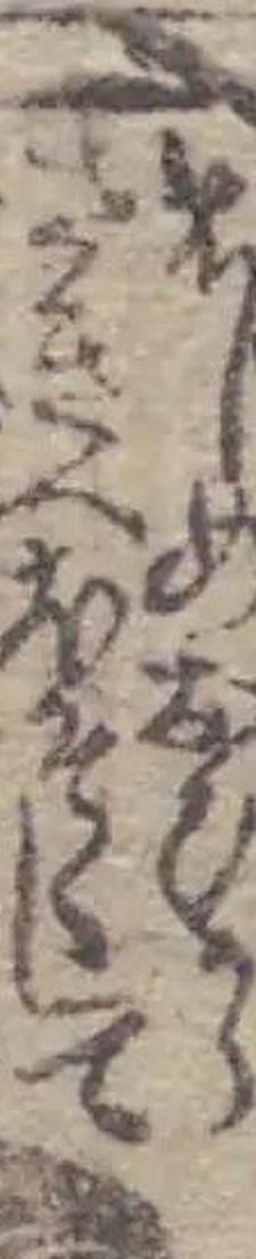さきへほそくして
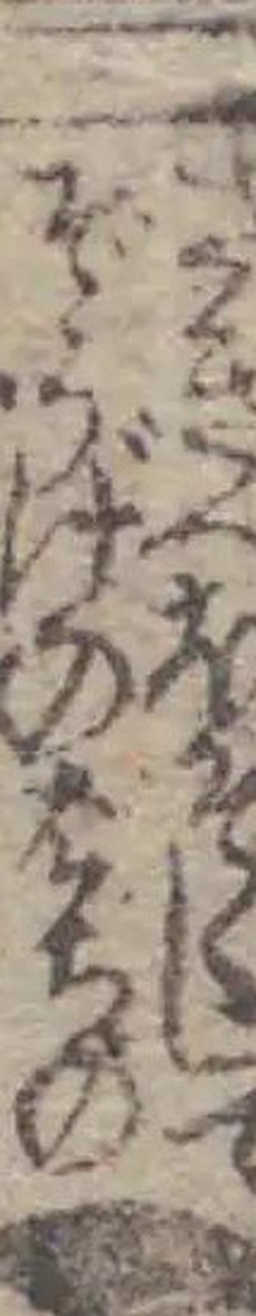ぞうげのばちの
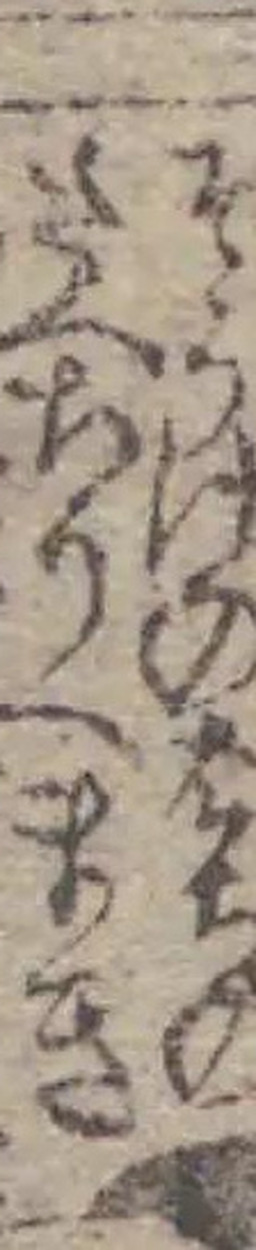さへちりへまき
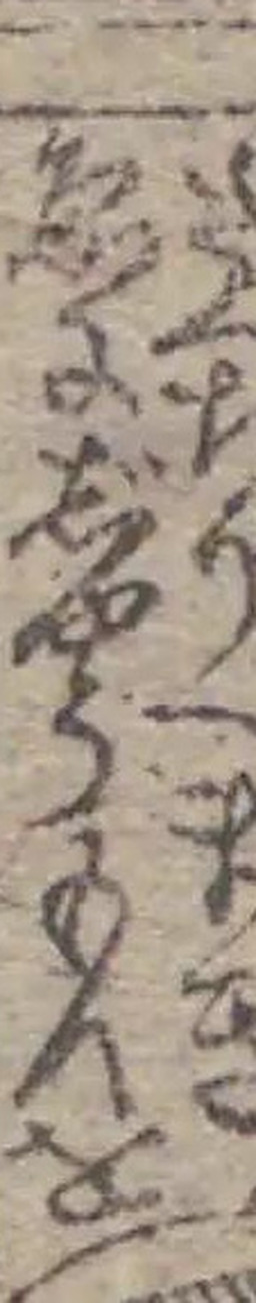ゑにじやうもんを
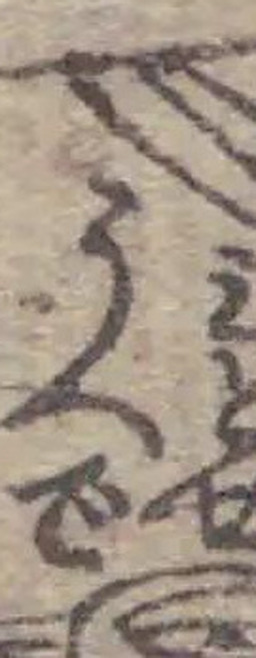うへで
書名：津以曽無弟の甚六 3巻
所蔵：国立国会図書館 National Diet Library, JAPAN
